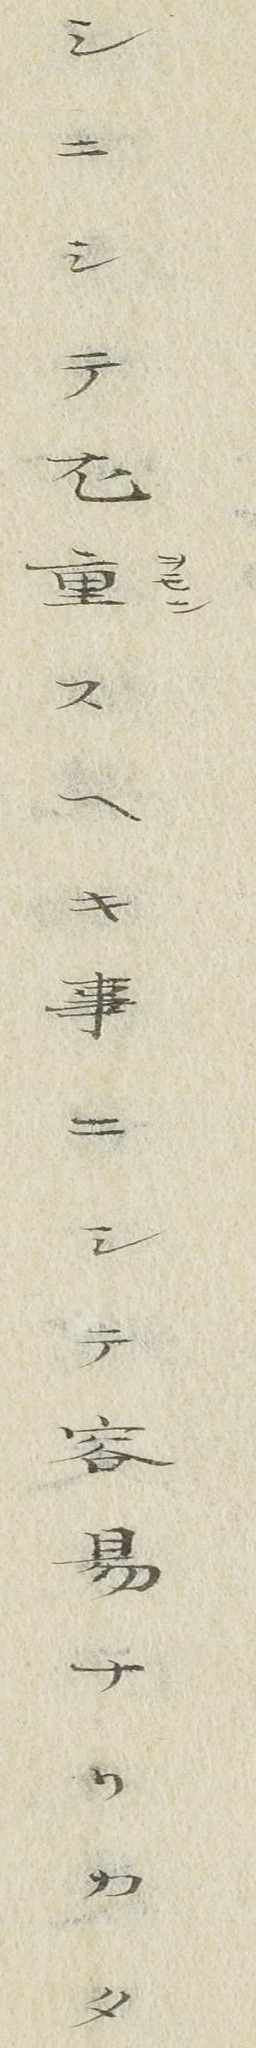シニシテ左重スヘキ事ニシテ容易ナリカタ
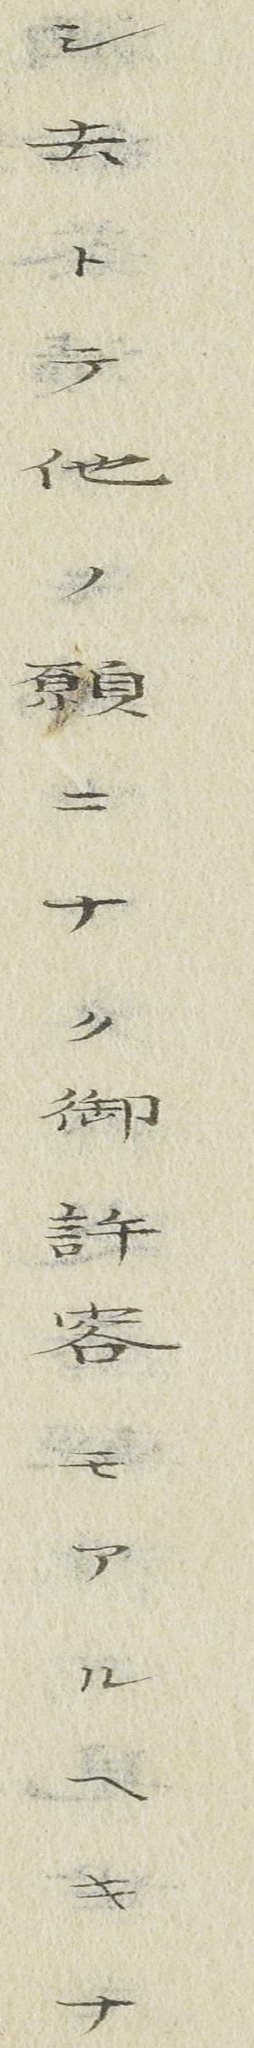シ去トテ他ノ願ニナク御許容モアルヘキナ
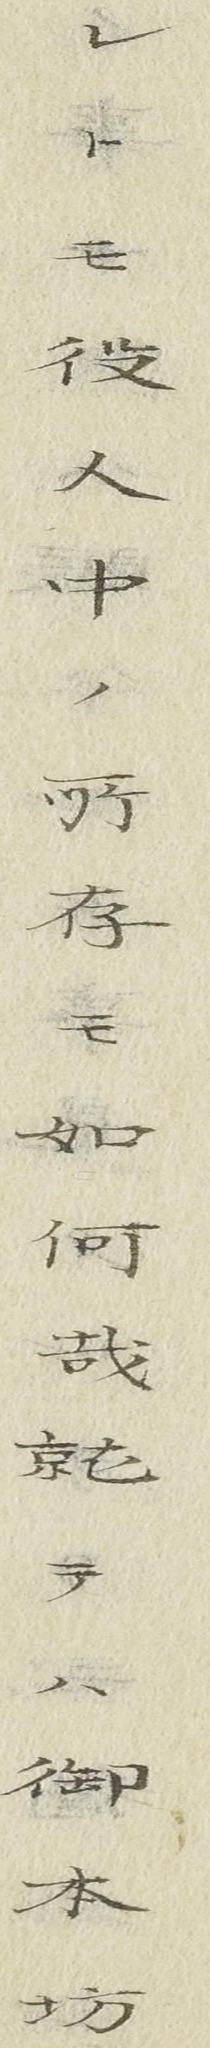レトモ役人中ノ所存モ如何哉就テハ御本坊
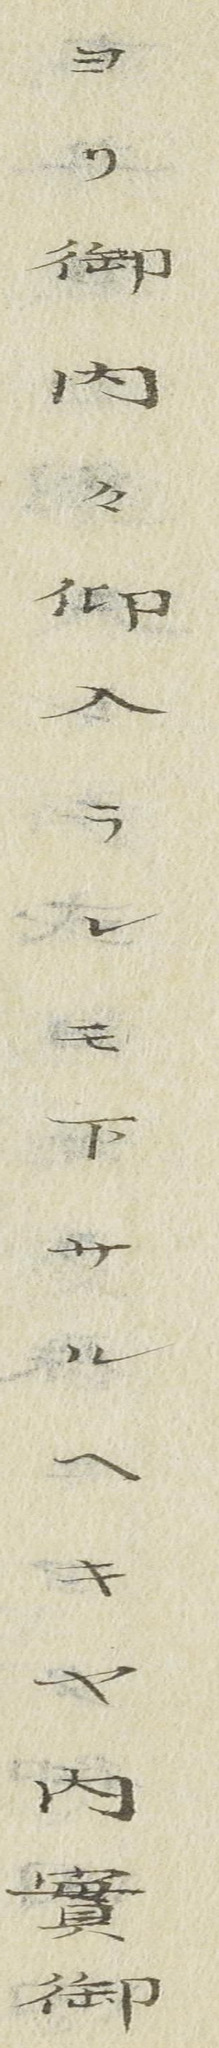ヨリ御内々仰入ラレモ下サルヘキヤ内実御
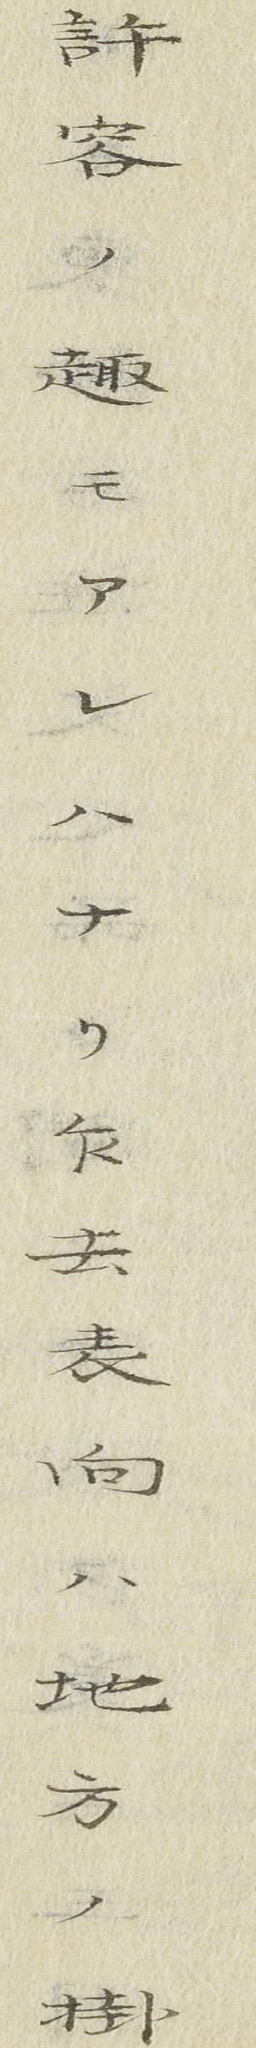許容ノ趣モアレハナリ乍去表向ハ地方ノ掛
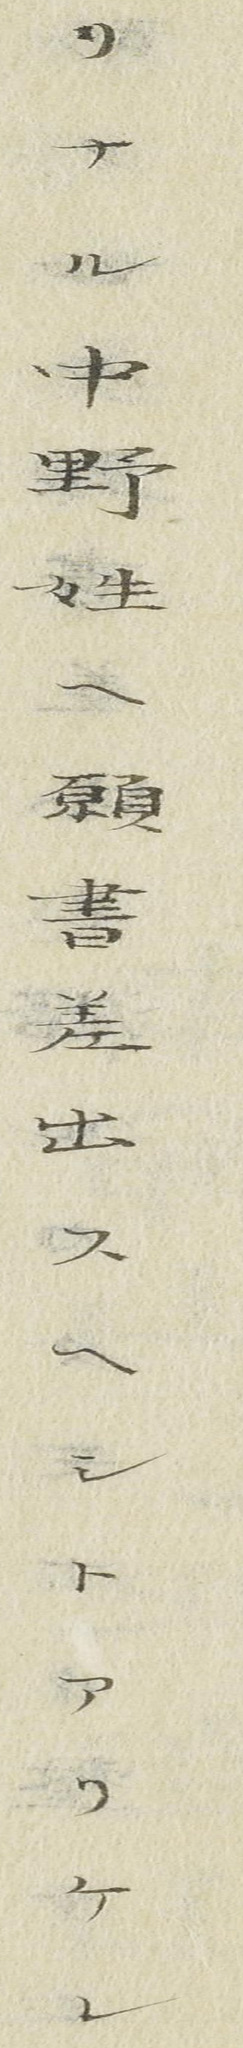リナル中野姓ヘ願書差出スヘシトアリケレ
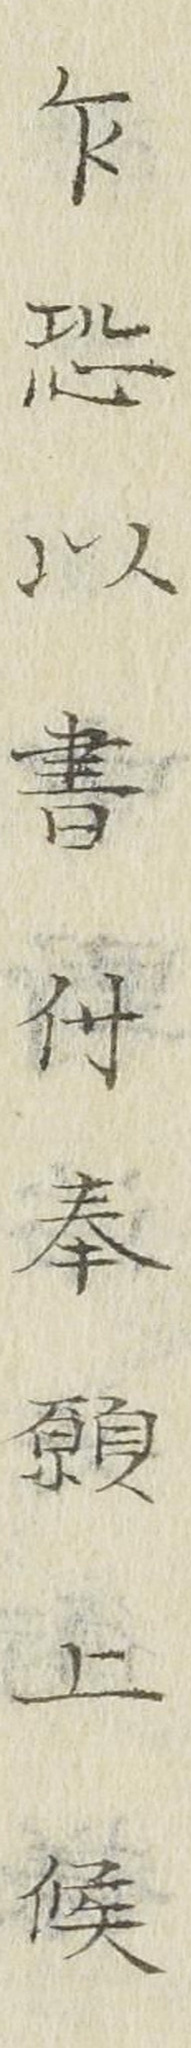乍恐以書付奉願上候
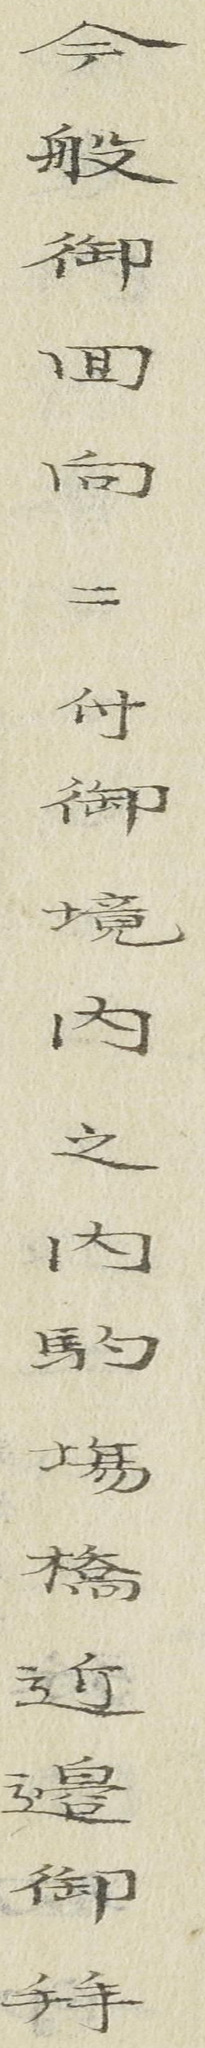今般御回向ニ付御境内之内駒場橋近辺御拝
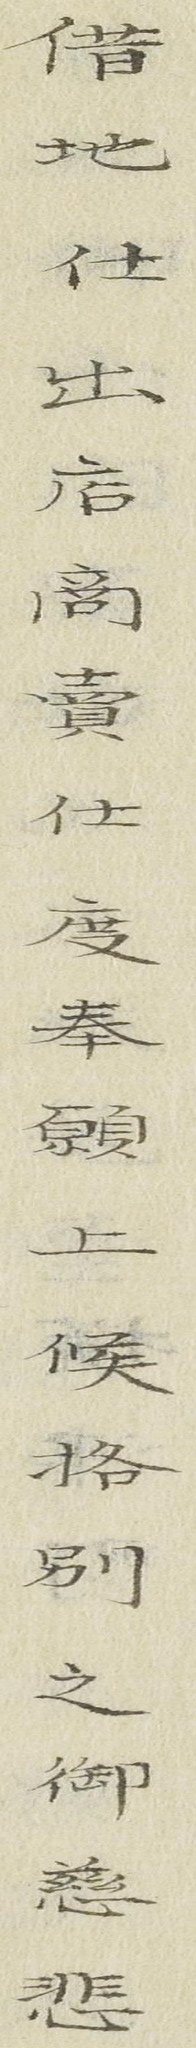借地仕出店商売仕度奉願上候格別之御慈悲
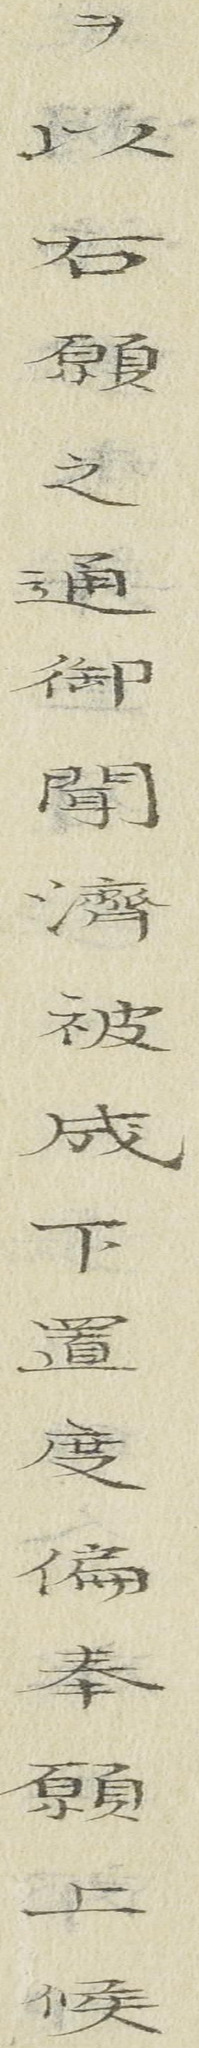ヲ以右願之通御聞済被成下置度偏奉願上候

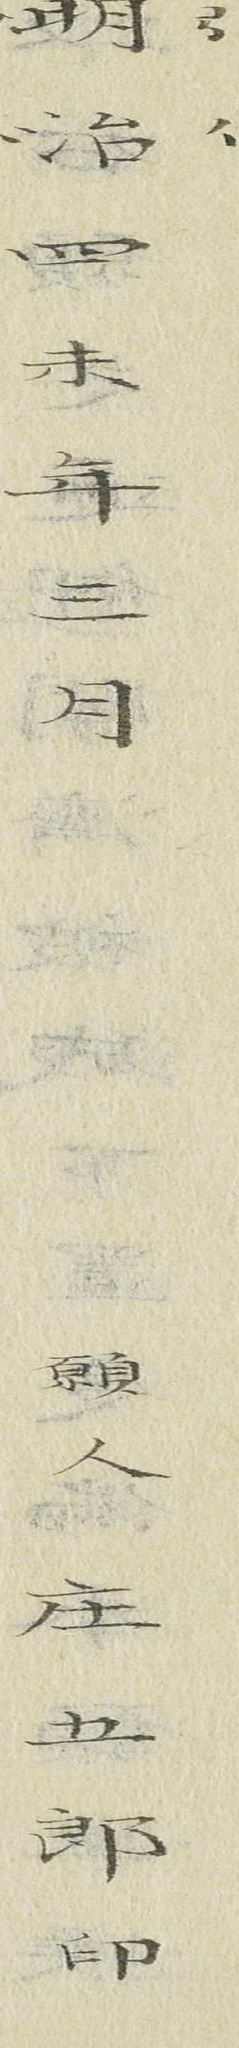明治四未年三月願人庄五郎印
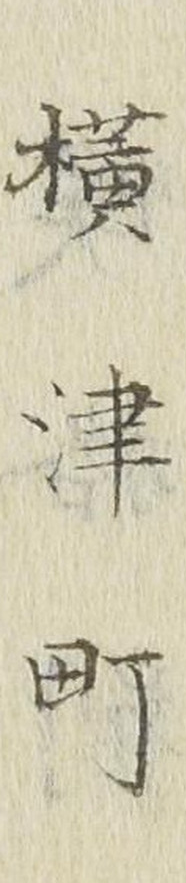横津町
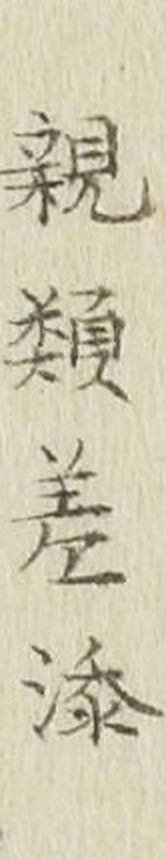親類差添
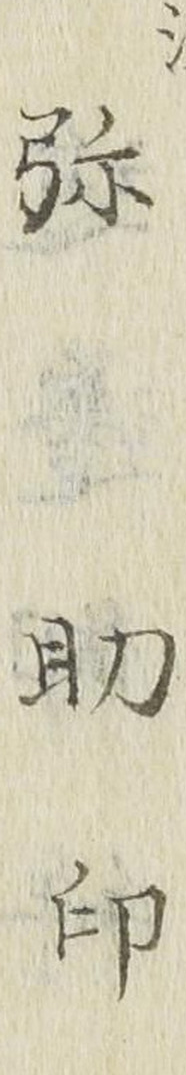弥助印
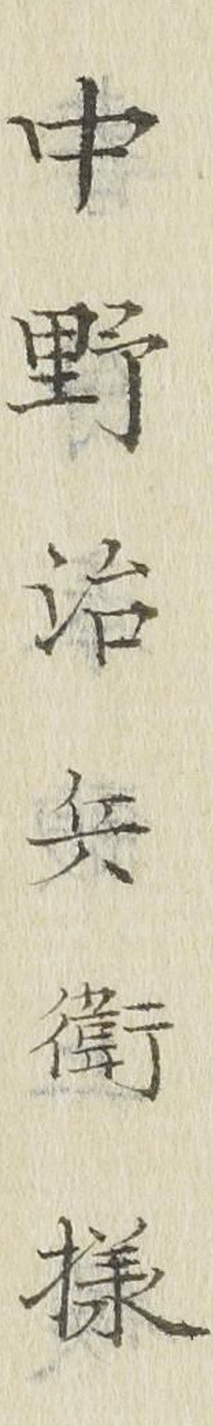中野治兵衛様
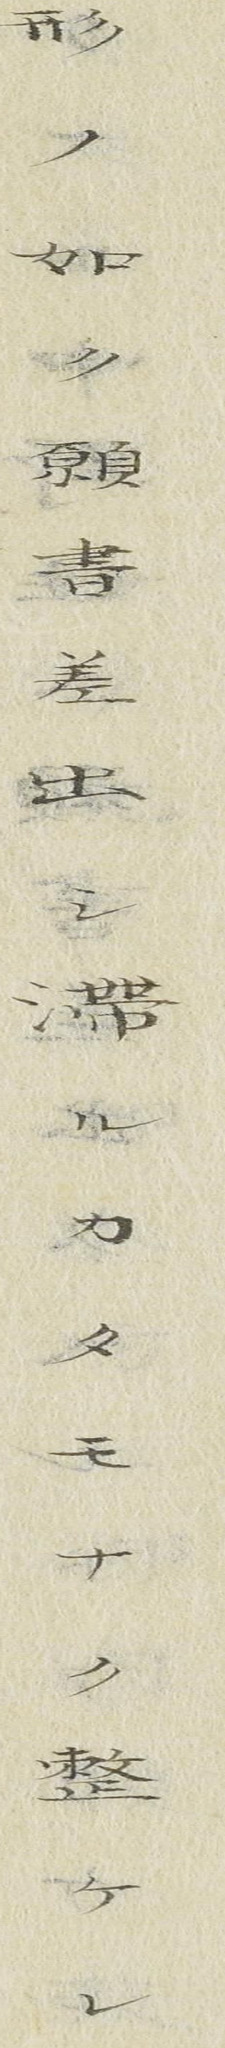形ノ如ク願書差出シ滞ルカタモナク整ケレ
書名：地災撮要　地震之部　巻ノ二
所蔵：東京大学地震研究所図書室 Earthquake Research Institute Library, The University of Tokyo, JAPAN
